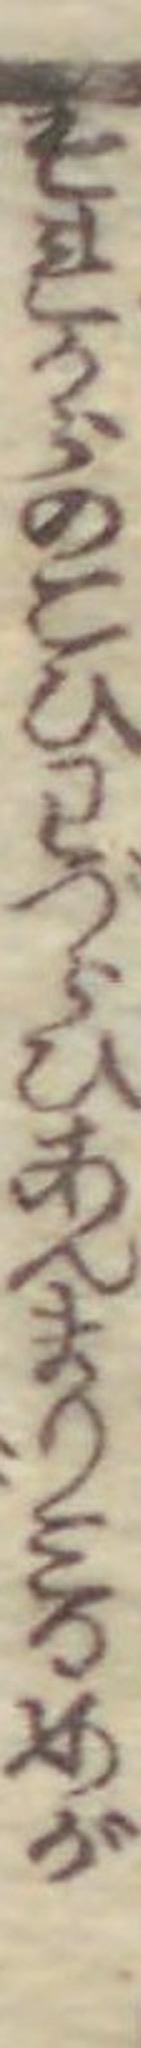それからのこひわづらひあんまりみるめが
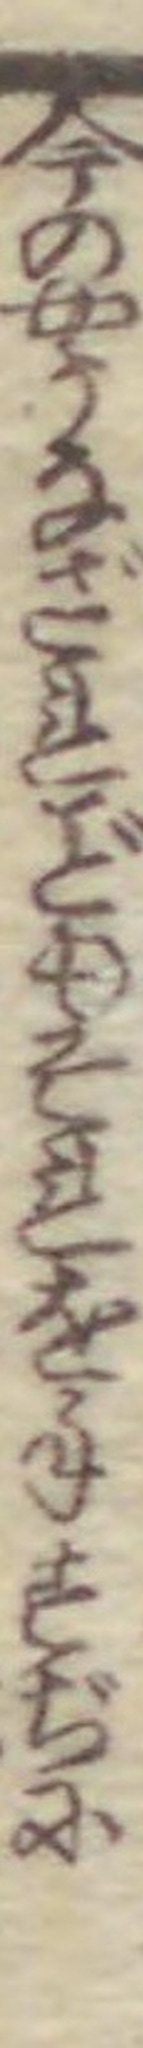今のやうなざれごともそれを手すぢに
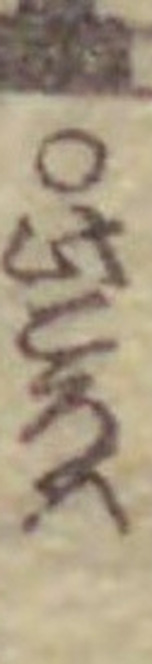○此ころは
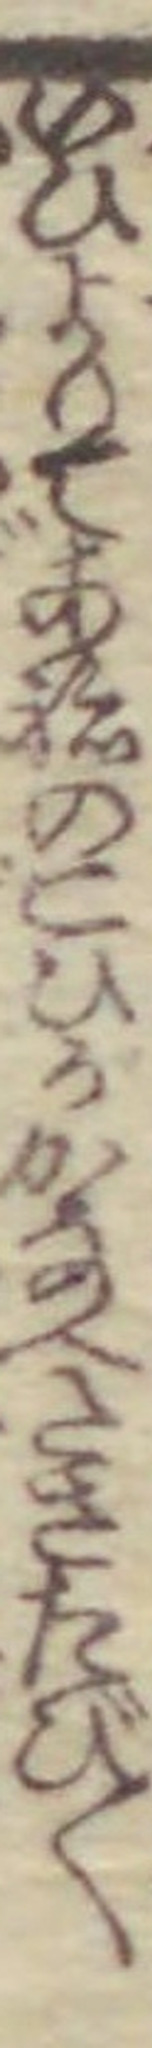いひよりてあねのこひかなへたきたび〳〵
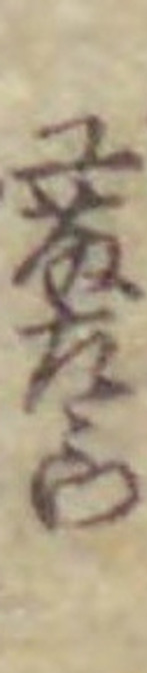工藤左衛門
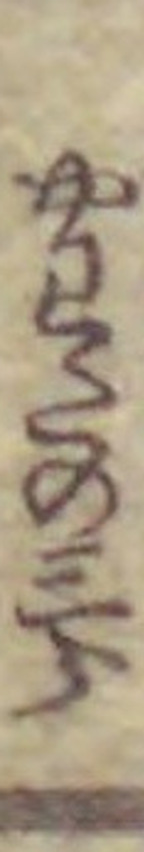やわたの三郎
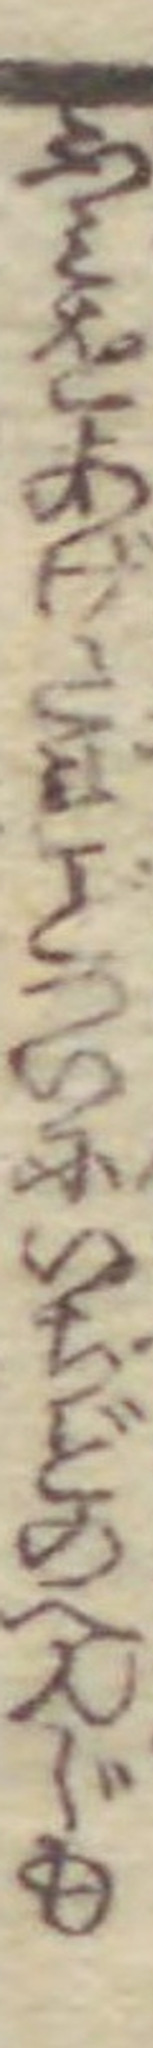ふみをあげられどついにいちどのへんじも
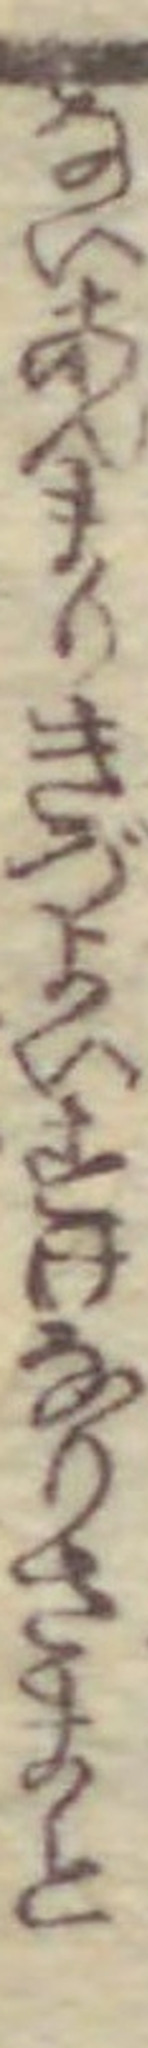ないあんまりきづよいすけなりさまと
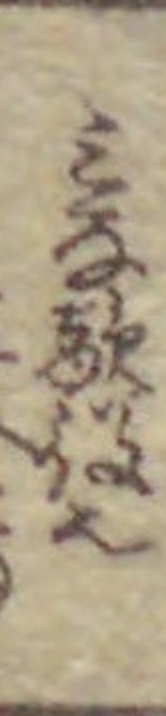みな敵役也
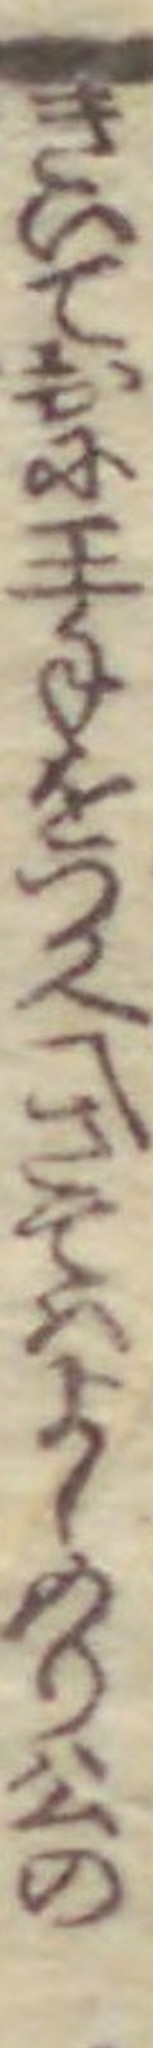きいておに王手をつかへさてはよしもり公の
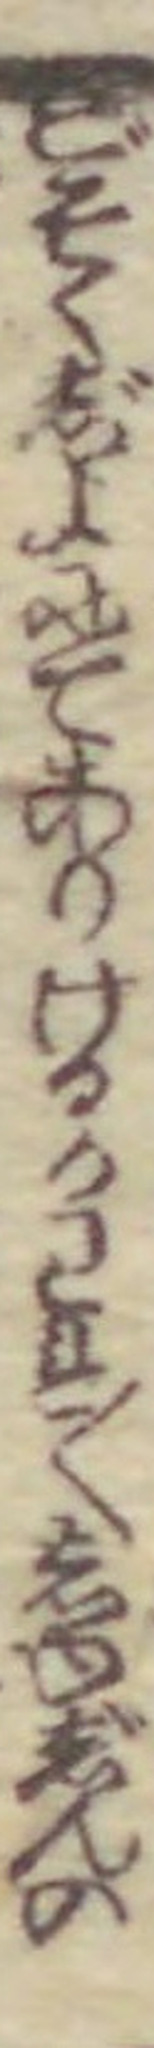ごそくじよにてありけるかわれ〳〵しゆじんの
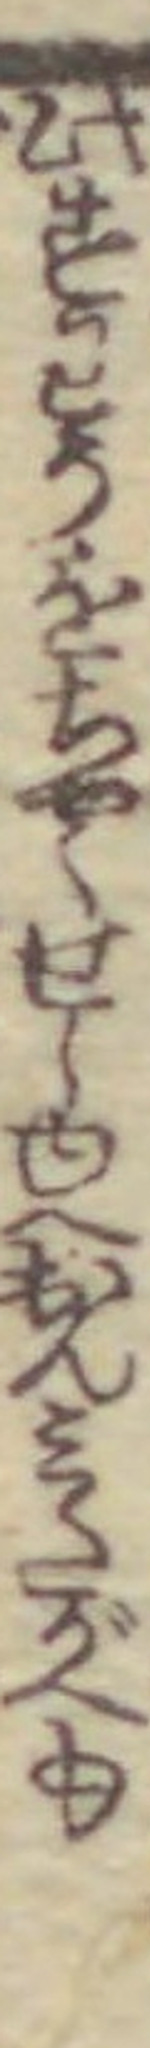此すわうをちやくせしゆへおんみたがへも
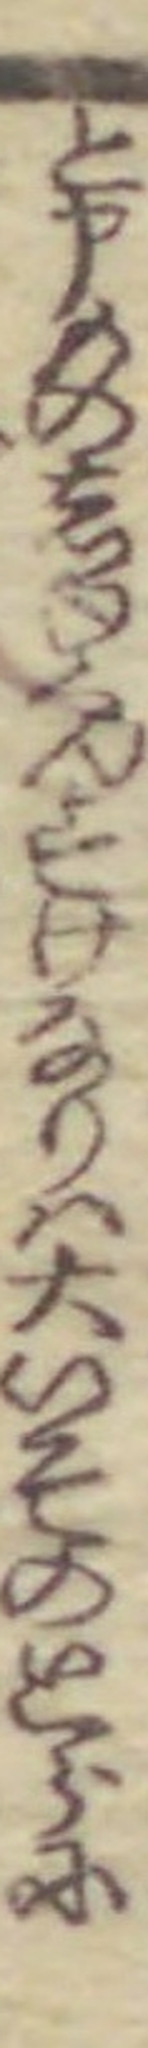と申ものしゆくんすけなりは大いそのとらに
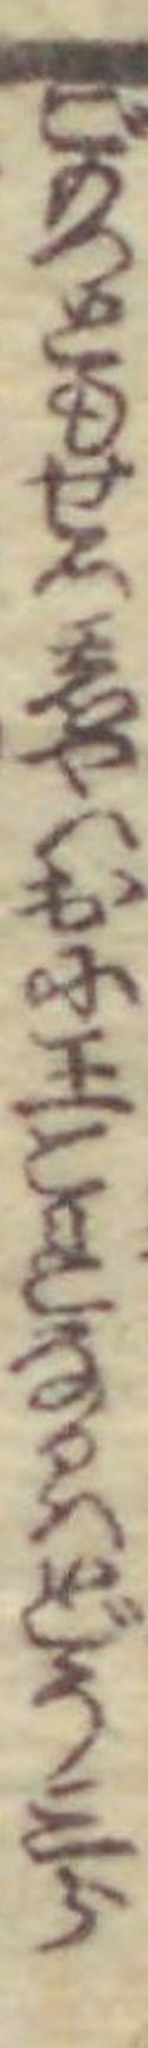ごもつともせつしやはおに王これなるはどう三郎
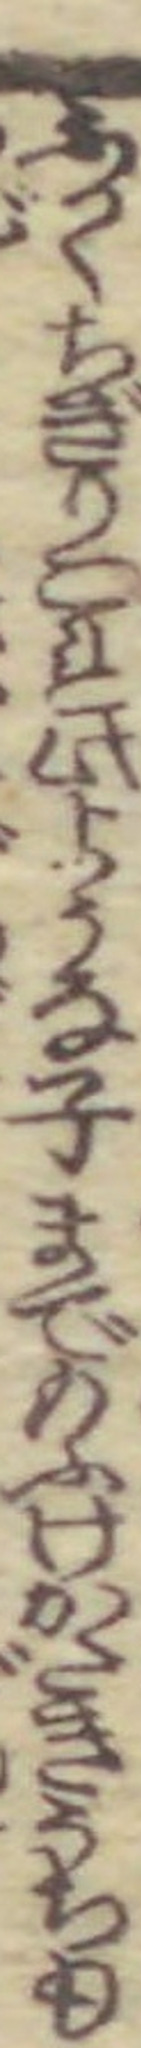ふかくちぎりこれ此ような子までもふけかたきうちも
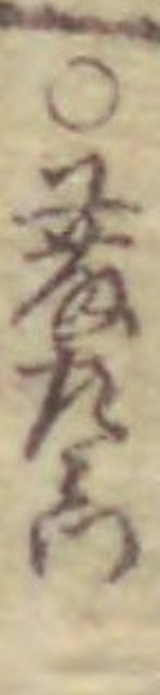○工藤左衛門
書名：大時代唐土化物 3巻. 曽我太夫染
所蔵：国立国会図書館 National Diet Library, JAPAN
